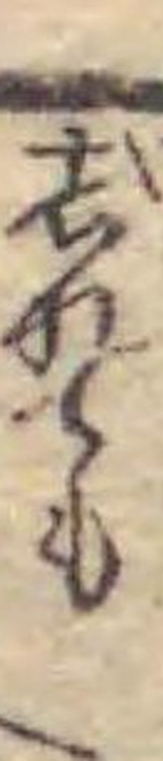しれても
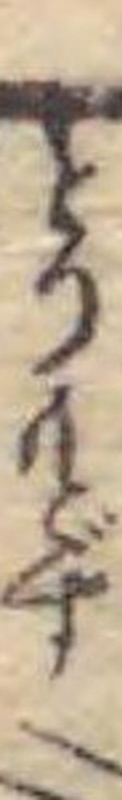とりもどす
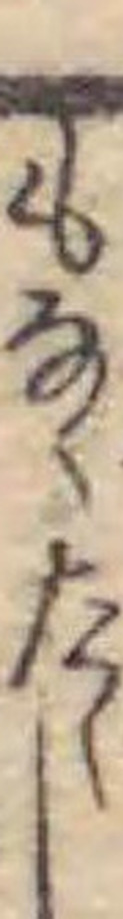もなくたゝ
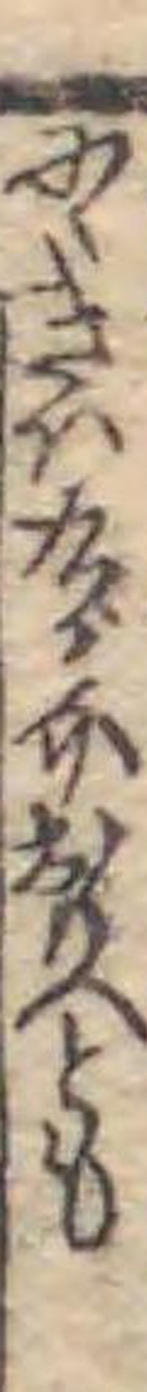にくきは九郎介おもへとも
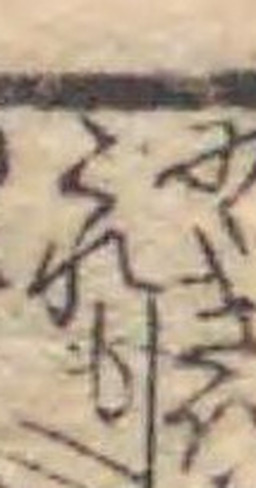これも
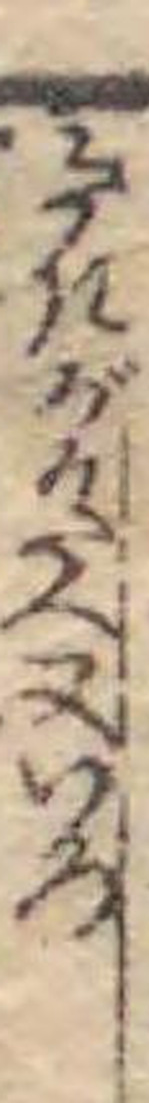さきがかたへ又いろ
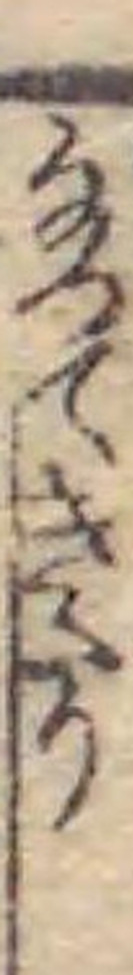なつてきたり
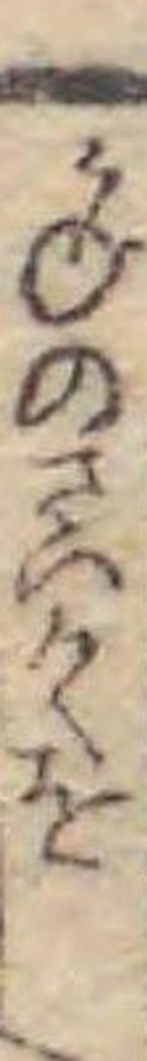かねのさいかくを
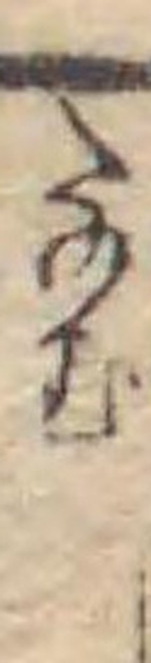たのむ
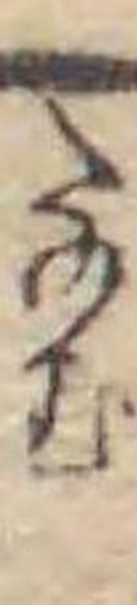たのむ
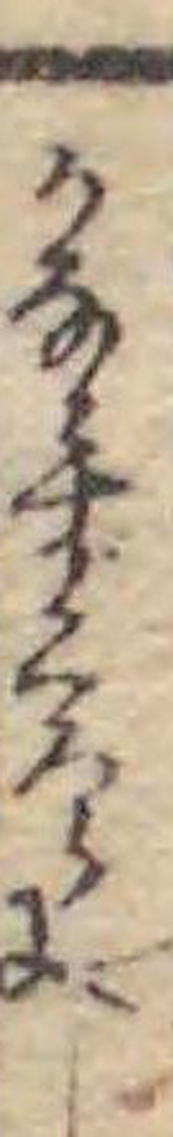かならずくろうに
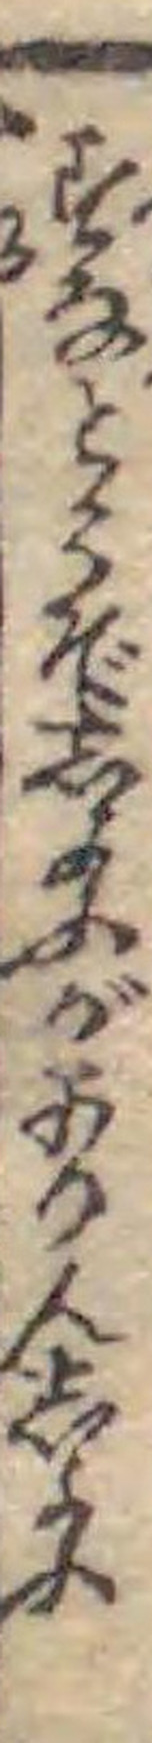すなとうぞしよふがありんしよふ
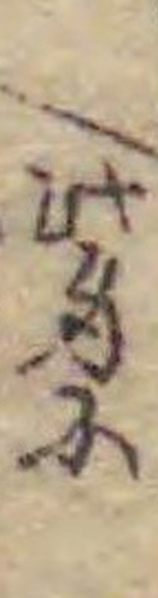此身に
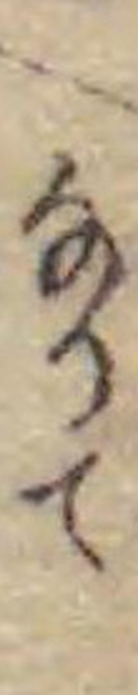なりて
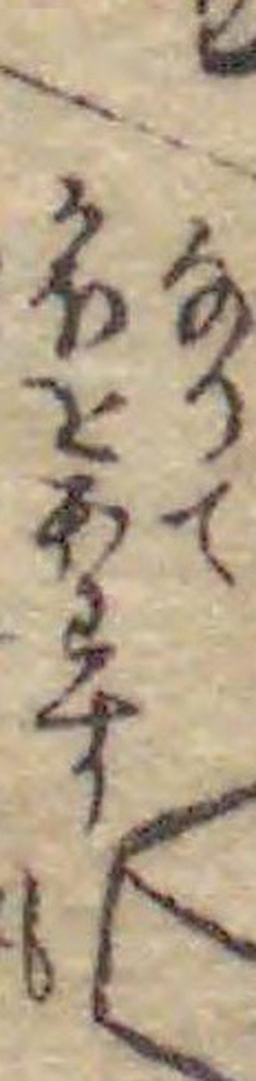かほをあわすも
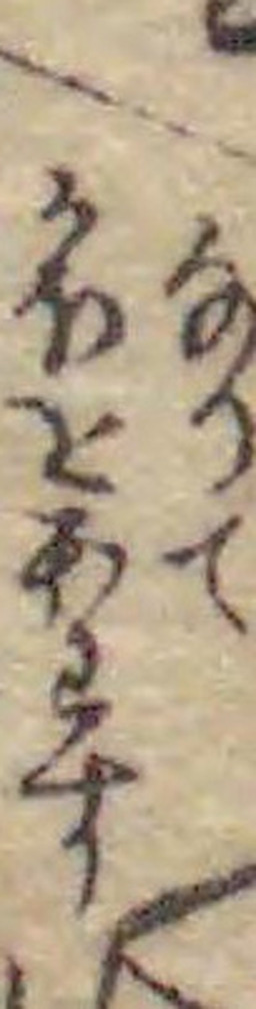かほをあわすも
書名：扨化狐通人 : 2巻
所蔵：国立国会図書館 National Diet Library, JAPAN
